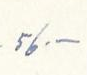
56
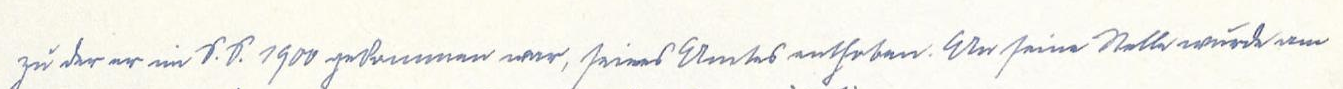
zu der er im SS 1900 gekommen war, seines Amtes enthoben. An seine Stelle wurde am
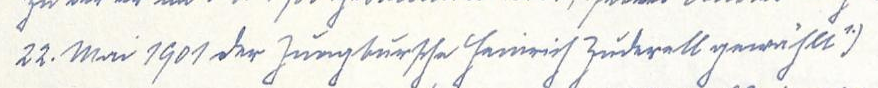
22. Mai 1901 der Jungebursche Heinrich Zuderell gewählt.1)
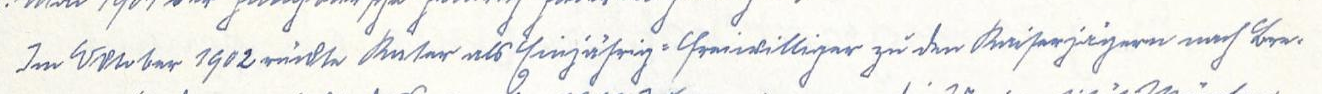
Im Oktober 1902 rückte Zuderell als Einjährig-Freiwilliger zu den Kaiserjägern nach Bre-
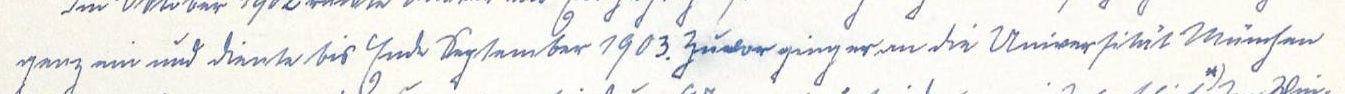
genz ein diente bis Ende September 1903. Zuvor ging er an die Universität München
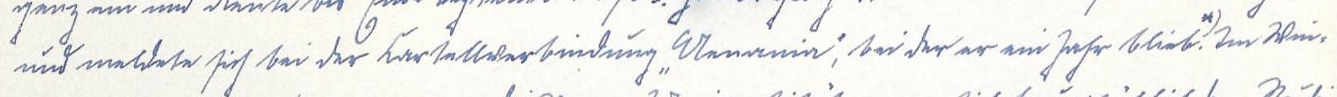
und meldete sich bei der Cartellverbindung „Oenania“ (x), bei der er im Jahr blieb 2). Im Win-
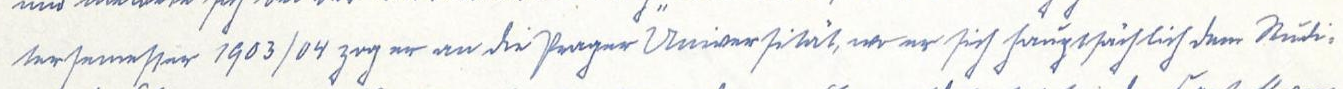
tersemester 1903/04 zog er an die Prager Universität, wo sich hauptsächlich dem Studi-
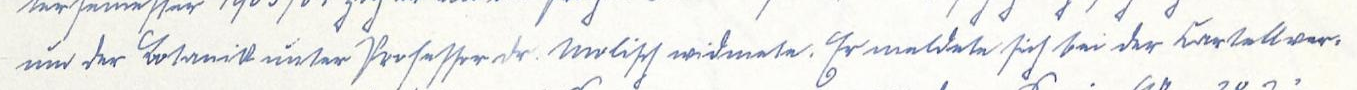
um der Botanik unter Professor Dr. Molitsch widmete. Er meldete sich bei der Cartellver-
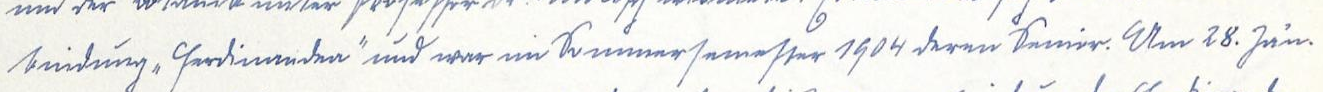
bindung „Ferdinandea“ und war im Sommersemester 1904 der Senior. Am 28. Jän-
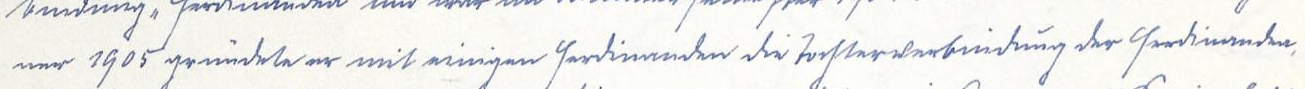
ner 1905 gründete er mit einigen Ferdinanden die Tochterverbindung der Ferdinandea,
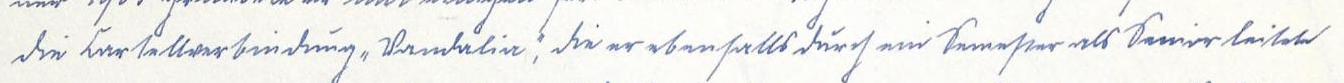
die Cartellverbindung „Vandalia“, die er ebenfalls durch ein Semester eines Senior leitete
